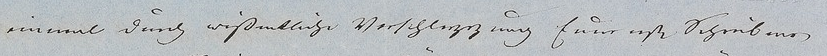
einmal durch wissentliche Verschleppung Euers ersten Schreibens,
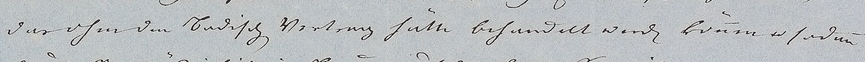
das ohne den Badischen Vertrag hätte behandelt werden können u sodann
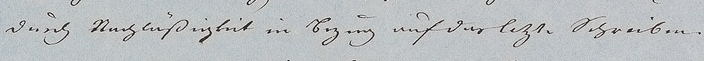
durch Nachläßigkeit in Bezug auf das letzte Schreiben.
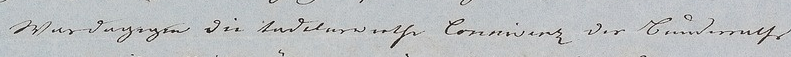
Was dagegen die tadelnswerte Connivenz des Bundesraths
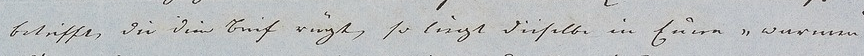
betrifft, die dein Brief rügt, so liegt dieselbe in Euern «warmen»
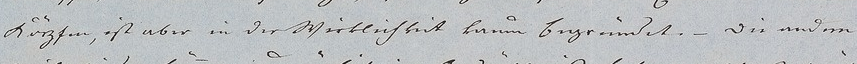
Köpfen, ist aber in der Wirklichkeit kaum begründet. – Die andern
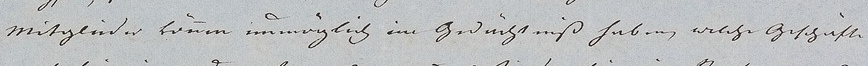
Mitglieder können unmöglich im Gedächtniß haben, welche Geschäfte
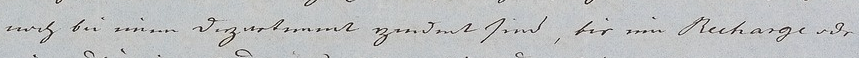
noch bei einem Departement pendent sind, bis eine Recharge odr
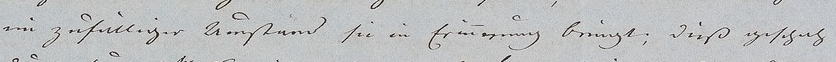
ein zufälliger Umstand sie in Erinnerung bringt; dieß geschah
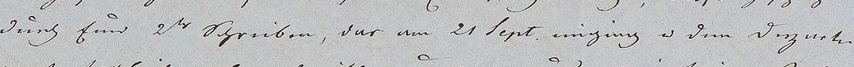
durch Euer 2ts Schreiben, das am 21 Sept. einging u dem Departe-
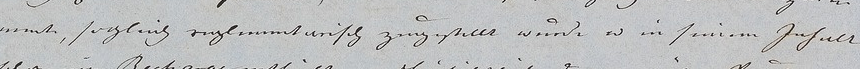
ment, sogleich reglementarisch zugestellt wurde u in seinem Inhalt
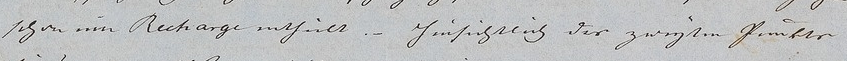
schon eine Recharge enthielt. – Hinsichtlich des zweyten Punkts
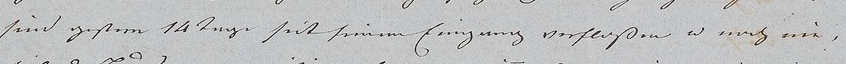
sind gestern 14 Tage seit seinem Eingang verflossen u noch nie,
